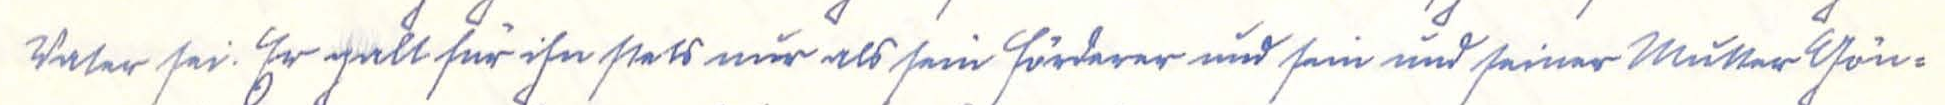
Vater sei. Er galt für ihn stets nur als sein Förderer uns sein und seiner Mutter Gön-
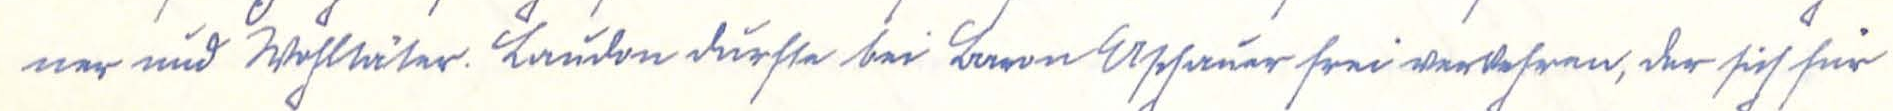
ner und Wohltäter. Laudon durfte bei Baron Aschauer frei verkehren, der sich für
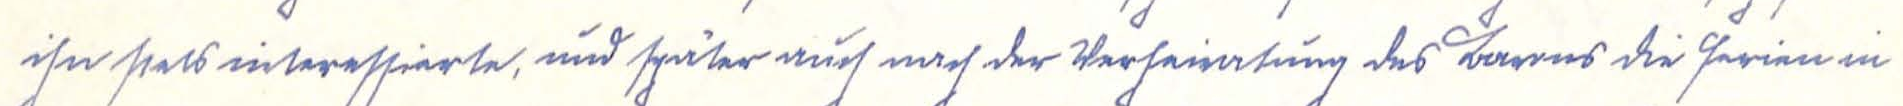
ihn stets interessierte, und später auch nach der Verheiratung des Barons die Ferien in
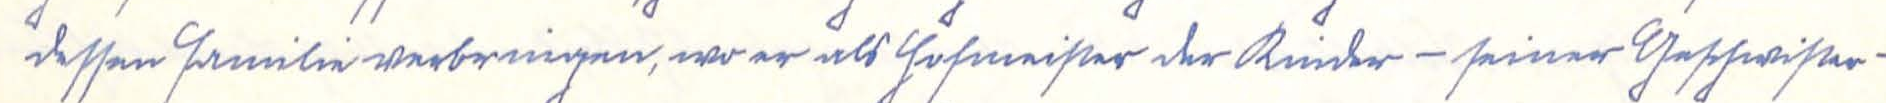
dessen Familie verbringen, wo er als Hofmeister der Kinder - seiner Geschwister
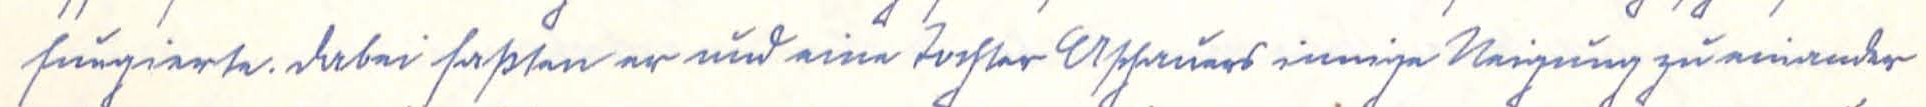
fungierte. Dabei faßten er und eine Tochter Aschauers innige Neigung zu einander
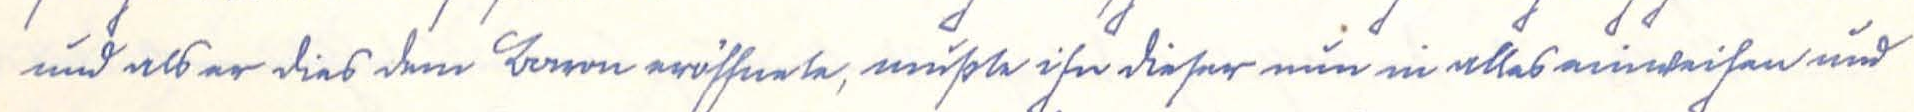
und als er dies dem Baron eröffnete, mußte ihn dieser nun in alles einweihen und
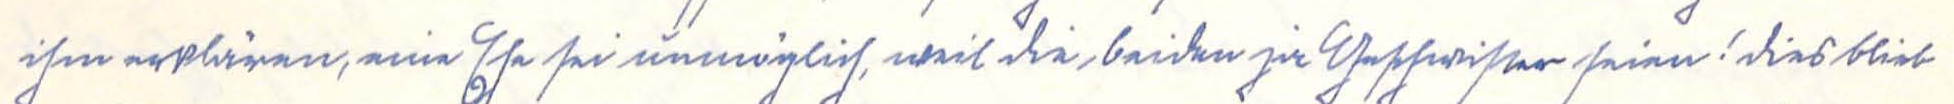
ihm erklären, eine Ehe sei unmöglich, weil die beiden ja Geschwister seien! Dies blieb
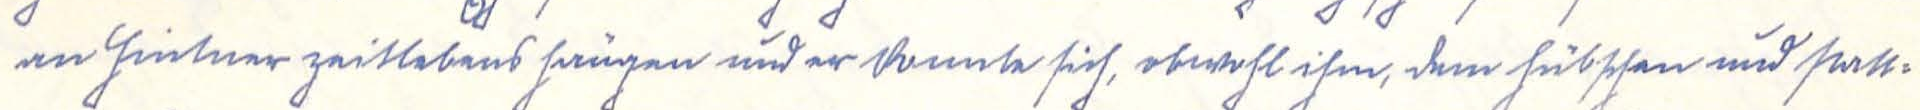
an Hintner zeitlebens hängen und er konnte sich, obwohl ihm, dem hübschen und statt-
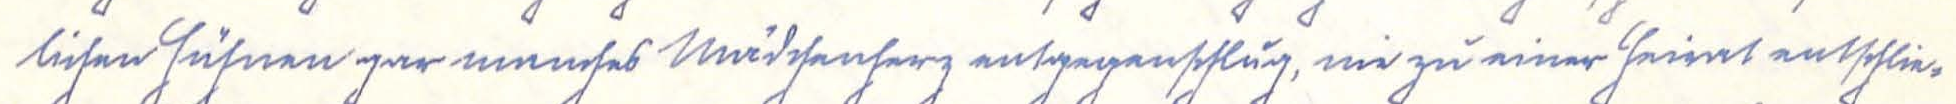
lochen Hühnen gar manches Mädchenherz entgegenschlug, nie zu einer Heirat entschlie-
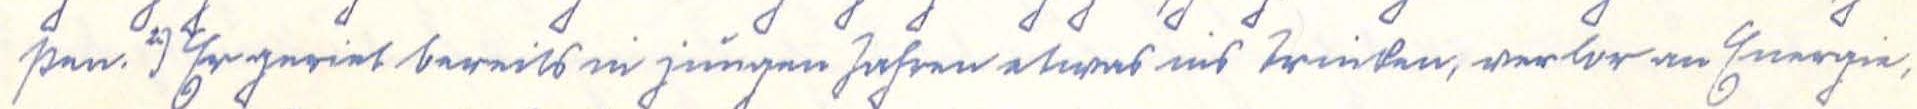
ßen. 2.)Er geriet bereits in jüngeren Jahren etwas ins trinken, verlor an Energie,
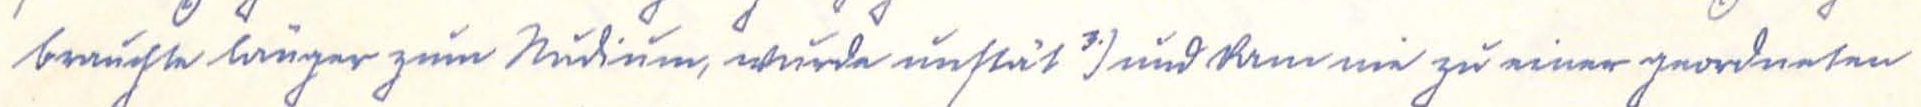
brauchte länger zum studieren, wurde unstät 3.) und kam nie zu einer geordneten
